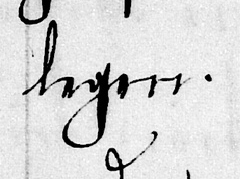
legen.
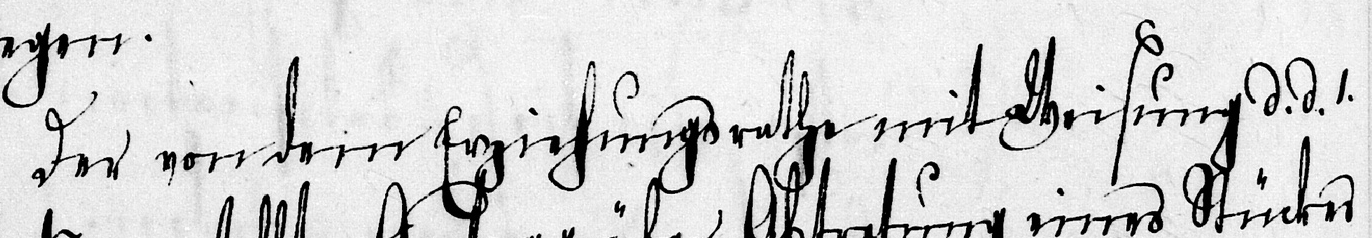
Der von dem Erziehungsrathe mit Weisung d. d.
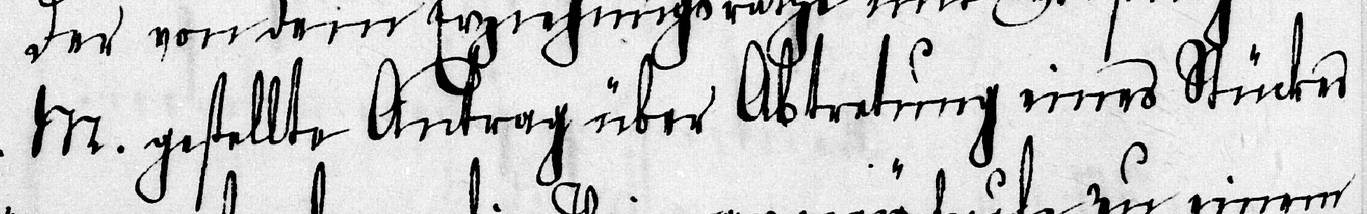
M. gestellte Antrag über Abtretung eines Stückes
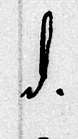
d.
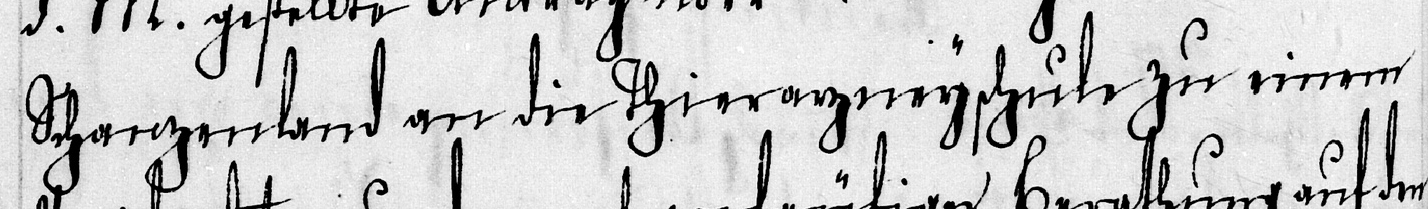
Schanzenland an die Thierarzneyschule zu einem
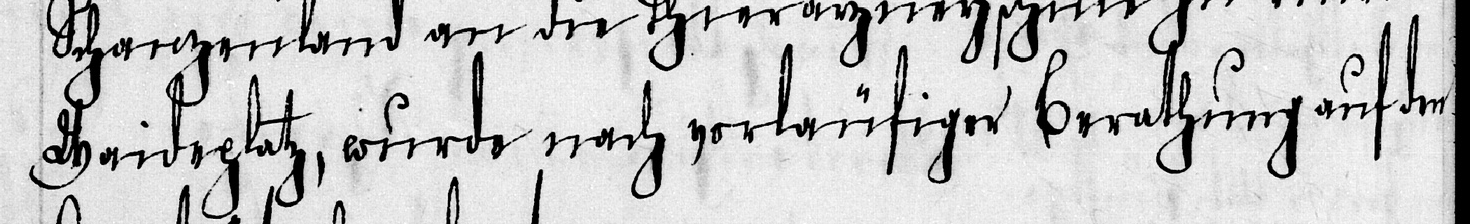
Waideplatz, wurde nach vorläufiger Berathung auf den
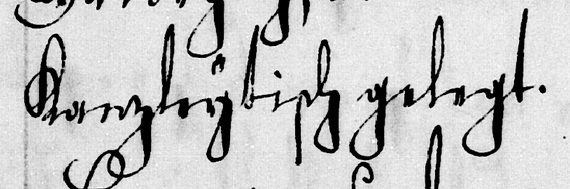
Kanzleytisch gelegt.
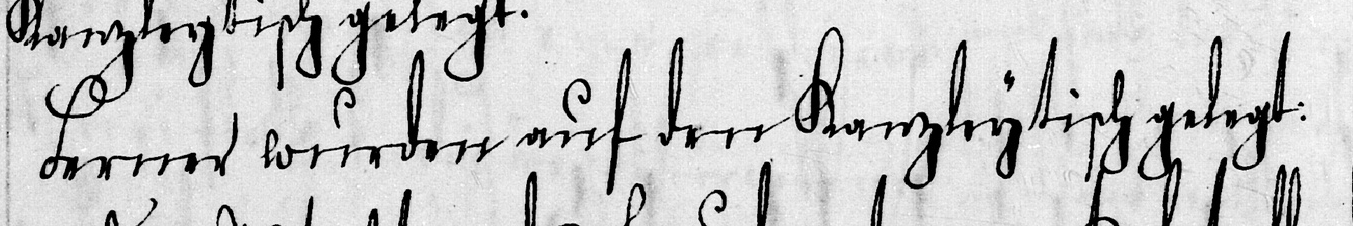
Ferner wurden auf den Kanzleytisch ge¬
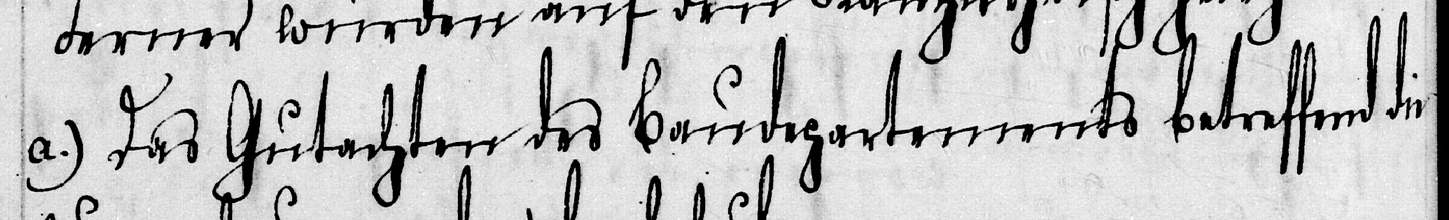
a.) Das Gutachten des Baudepartements betreffend
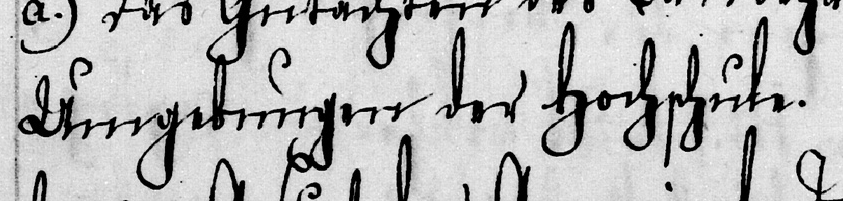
Umgebungen der Hochschule.
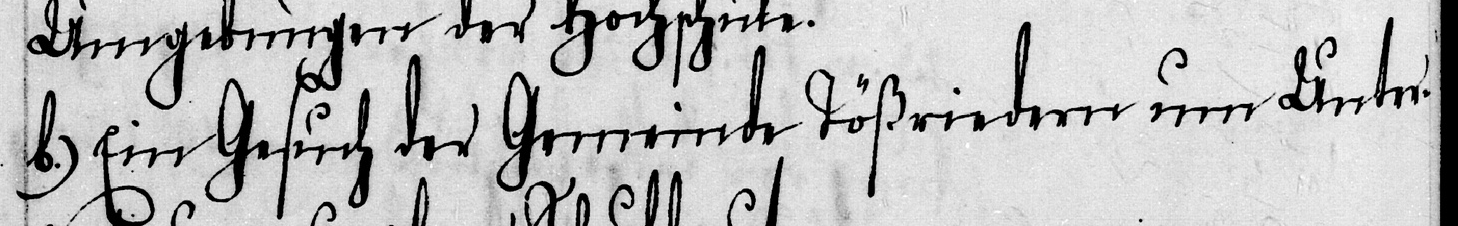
b.) Ein Gesuch der Gemeinde Tößriedern um Unter¬
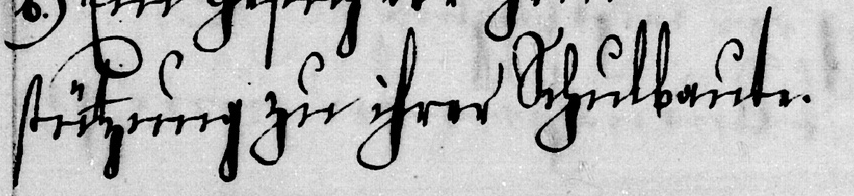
stützung zu ihrer Schulbaute.
